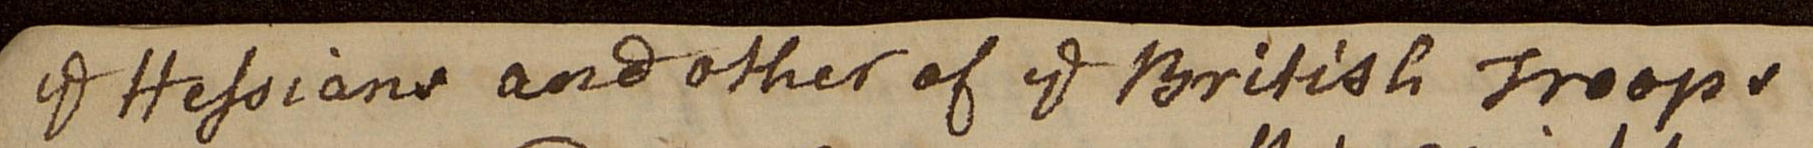y^e Hessians and other of y^ British Troops
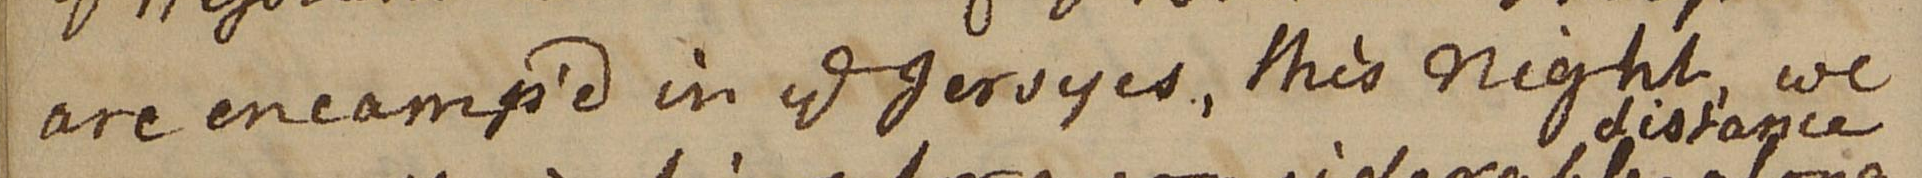are encamp'd in y^e Jersyes, this Night, we
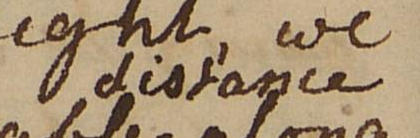distance
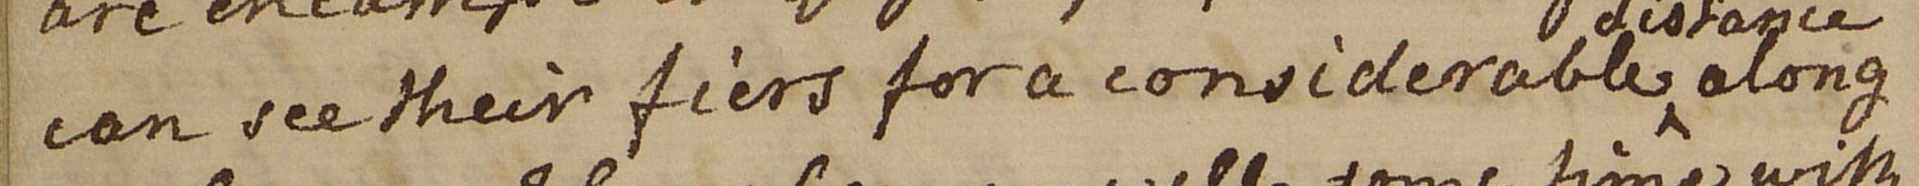can see their fiers for a considerable ^ along
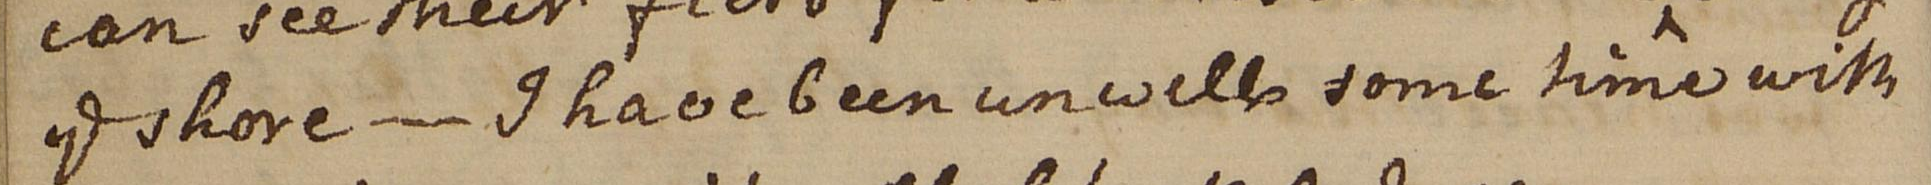y^e shore- I have been unwell some time with
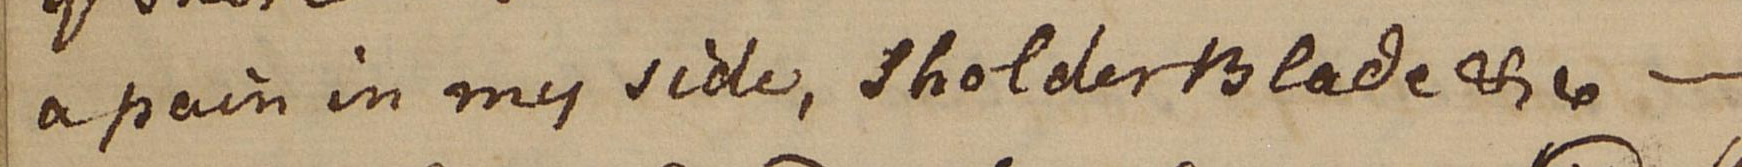a pain in my side, Sholder Blade &e-
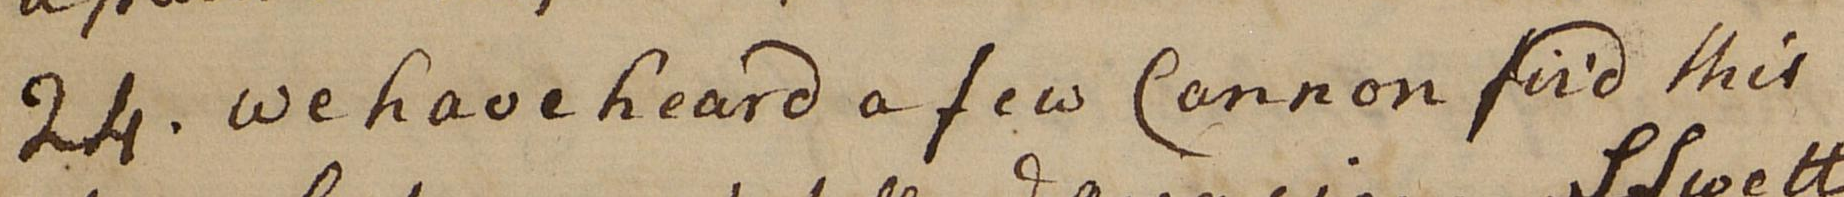24. we have heard a few Cannon fir'd this
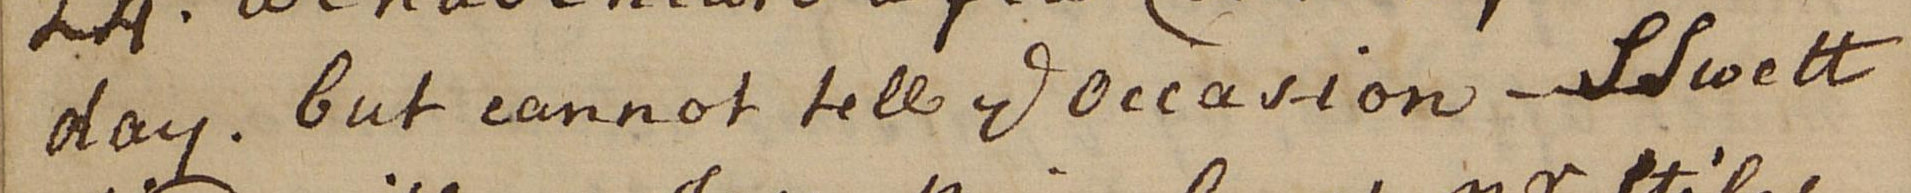day. but cannot tell y^e occasion- S Swelt
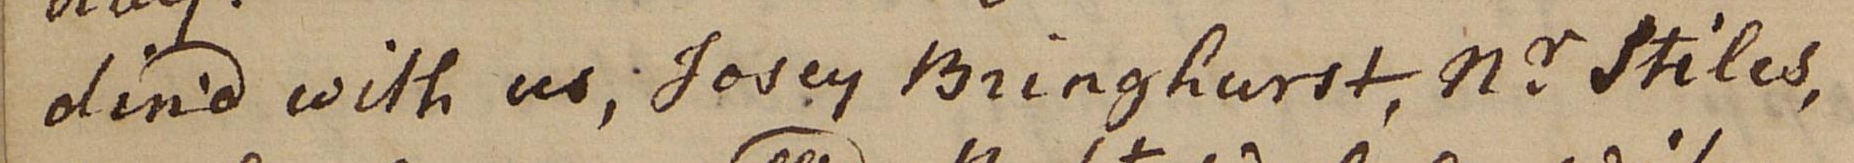dind with us; Josey Bringhurst, N^r. Stiles,
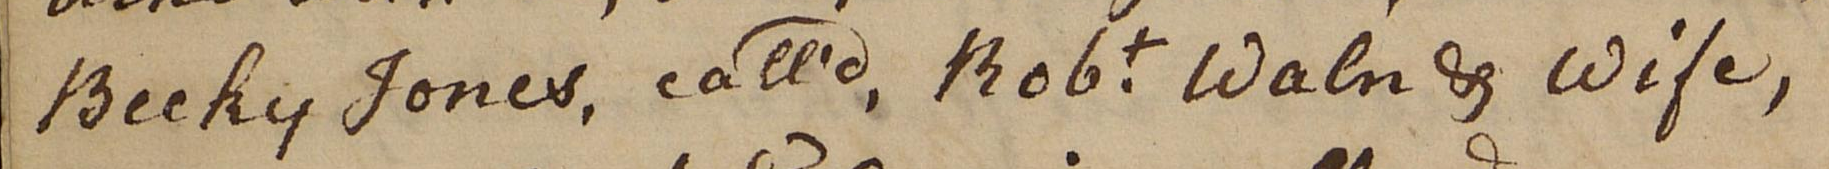Becky Jones, call'd, Rob^t. Waln & Wife,
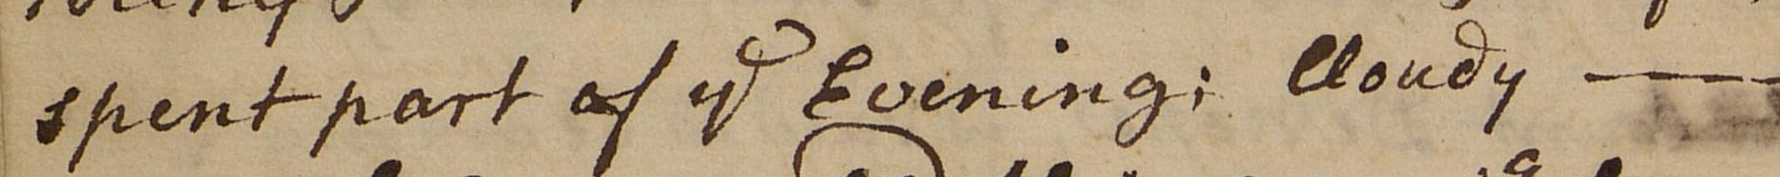spent part of y^e Evening; Cloudy-
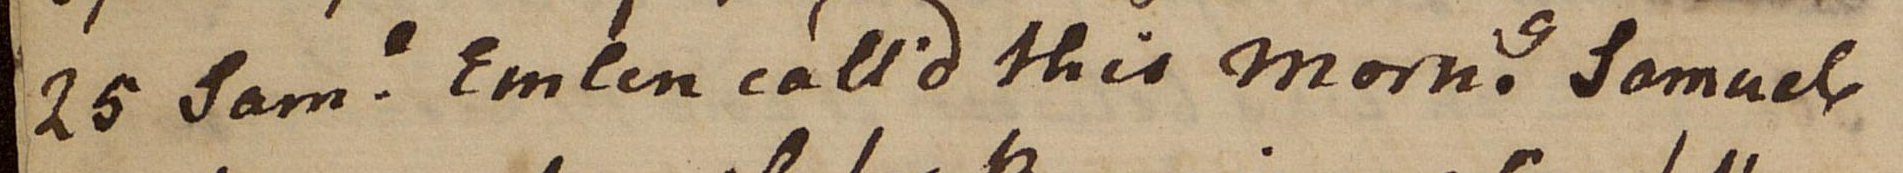25 Sam^l. Emlen call'd this Morn^g. Samuel
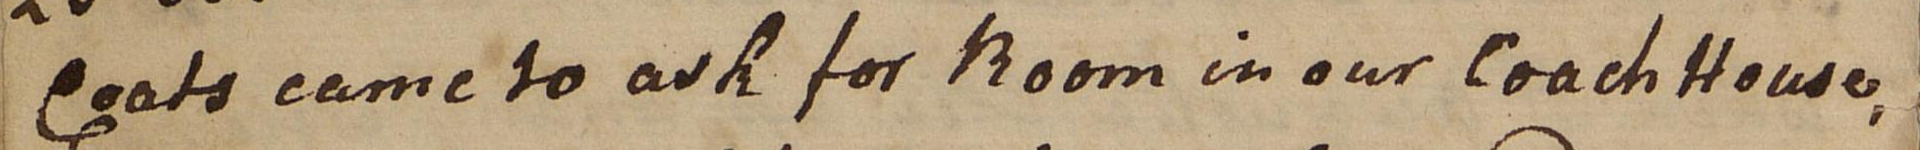coats came to ash for Room in our Coach House,
